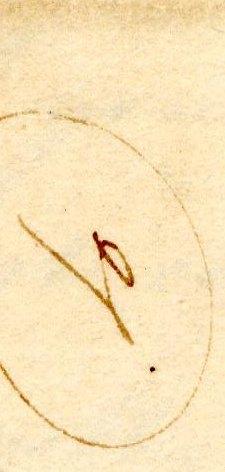To
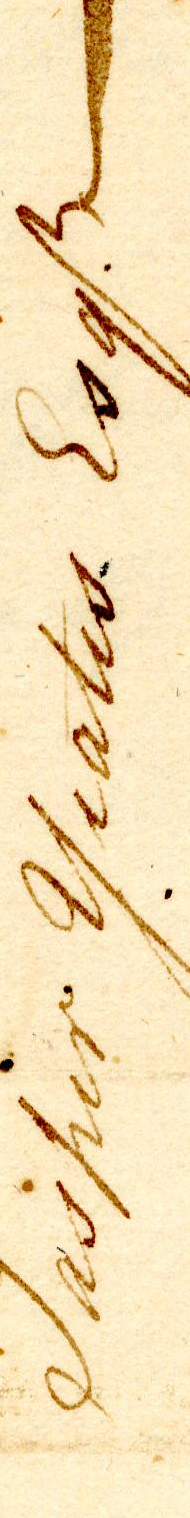Jasper Yeates. Esq^r.
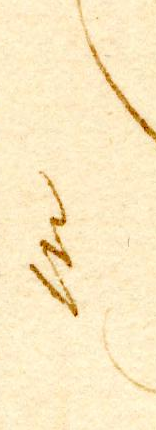in
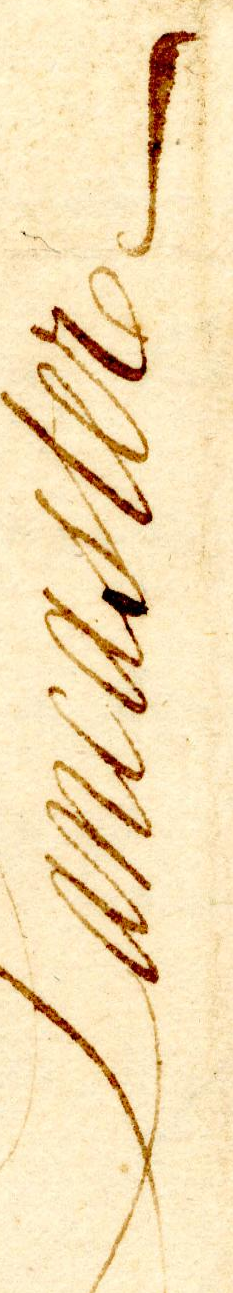Lancaster
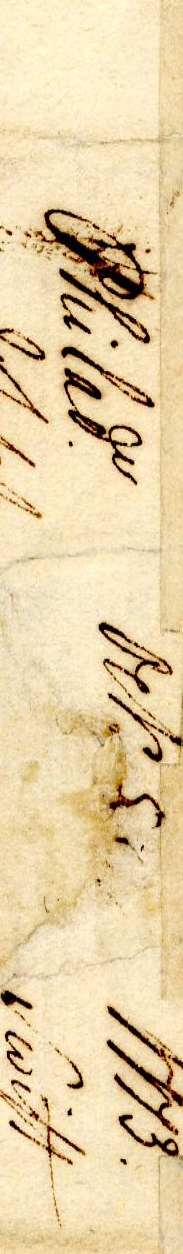Philad^a Oct^r. 5. 1773.
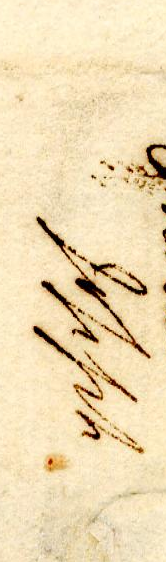Joseph
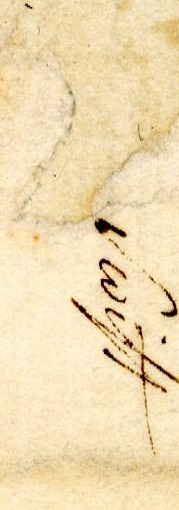Swift
